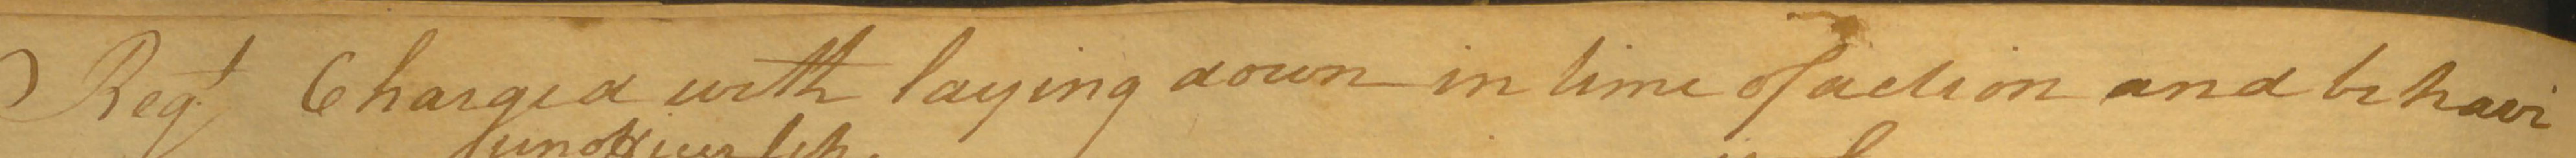Reg^t. Charged with laying down in time of action and behavi
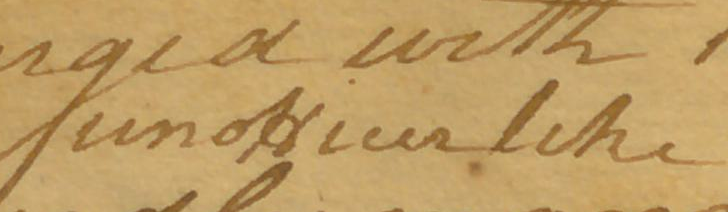unofficerlike
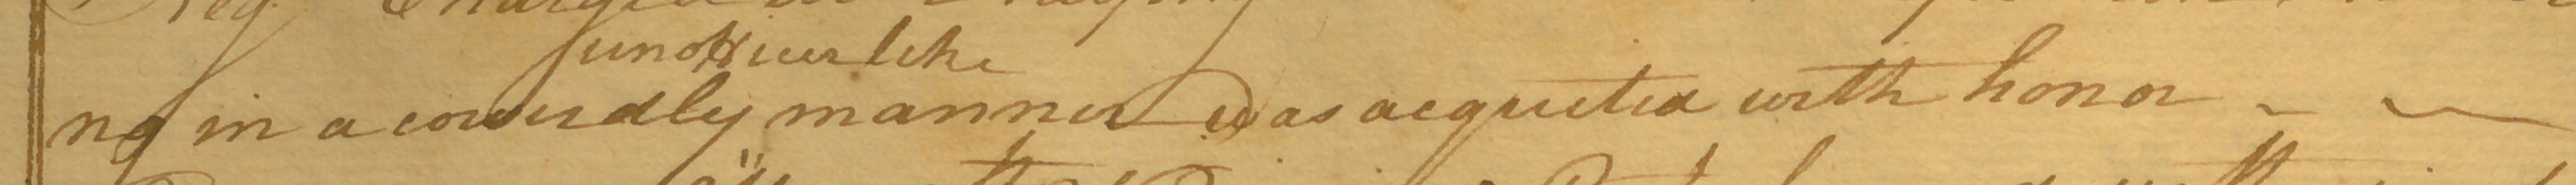ng in a cowardly manner was acquited with honor- -
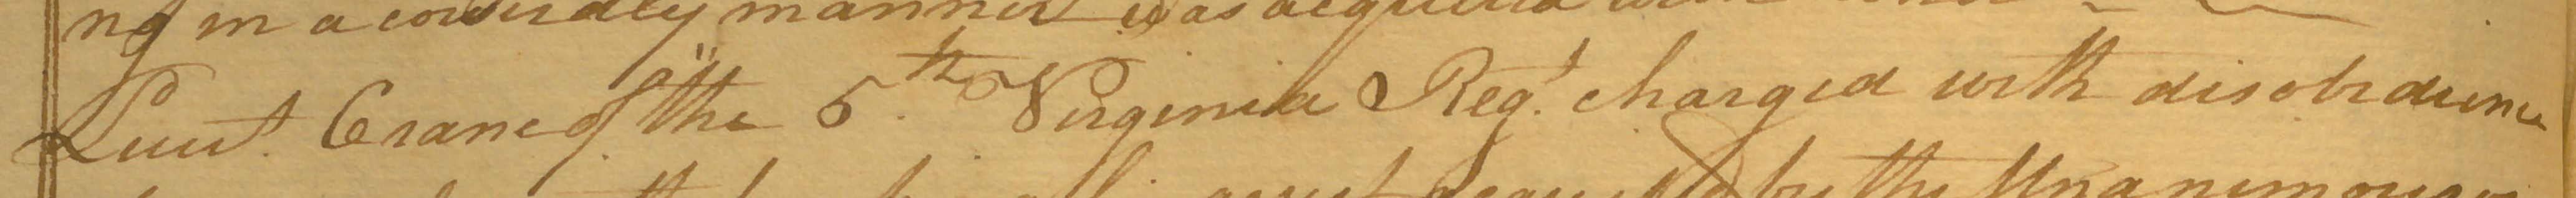Lieu^t. Crane of the 5^th Virginia Reg^t. charged with disobedience
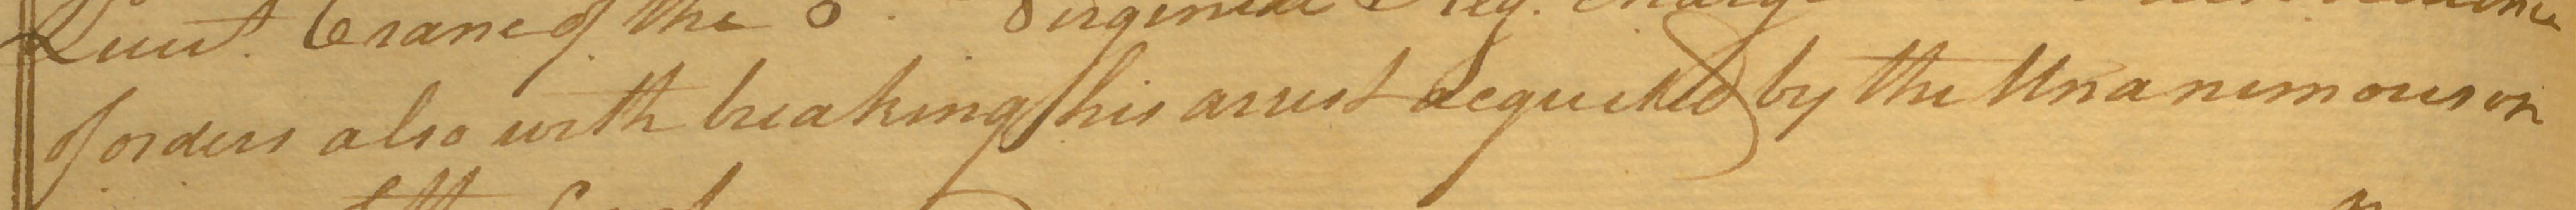of orders also with breaking his arrest acquitted by the Unanimous op
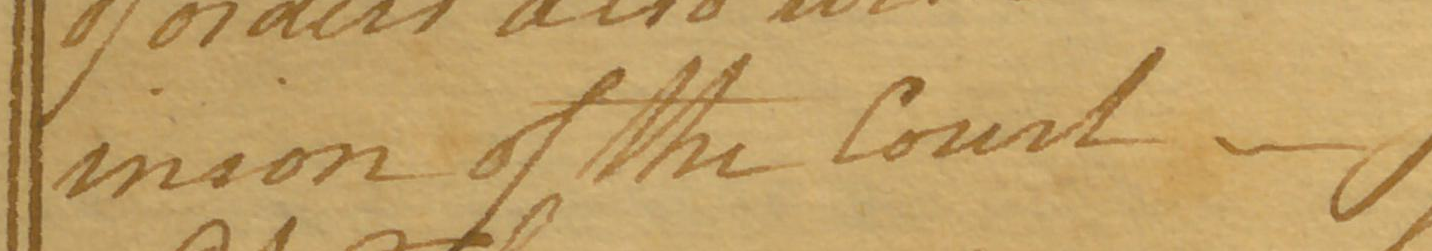inion of the Court-
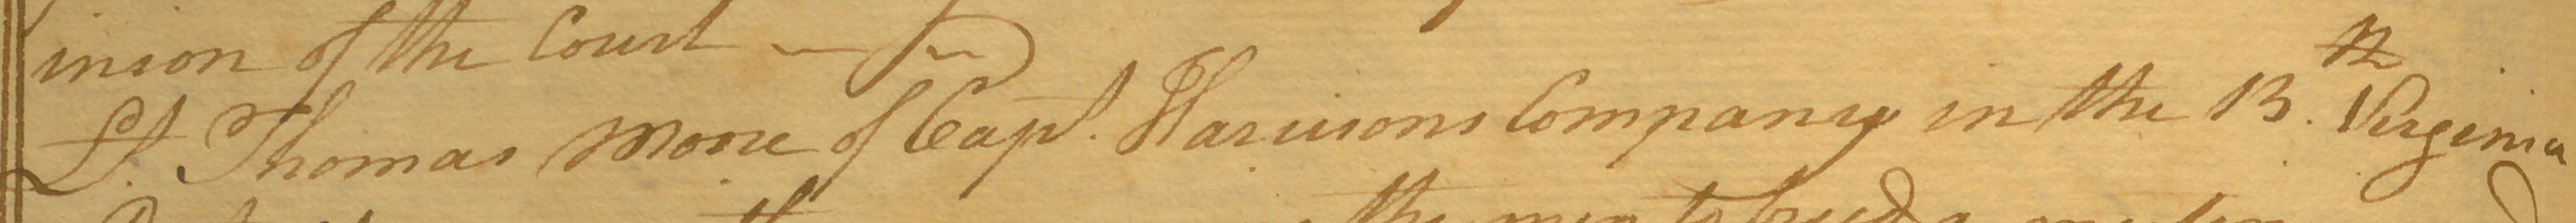L^t. Thomas Moore of Cap^t. Harrisons Company in the 13^th. Virginia
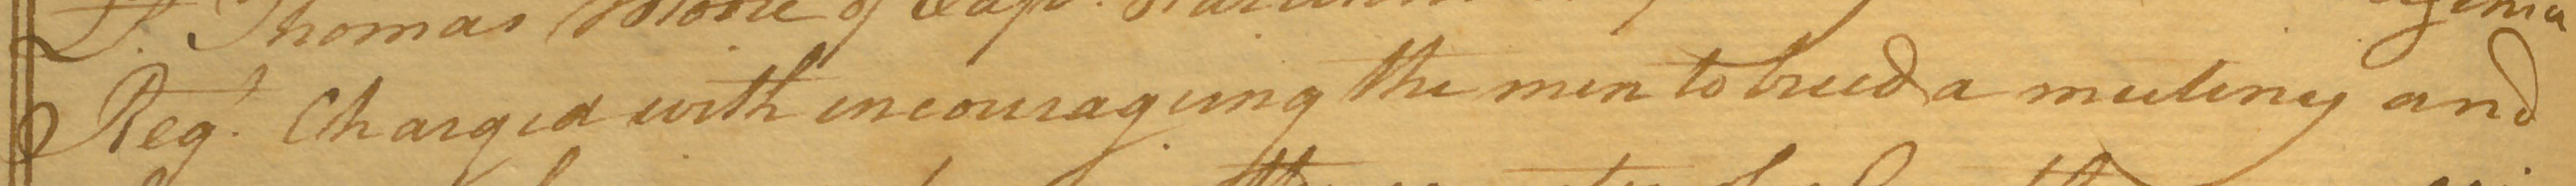Reg^t. charged with encouraging the men to breed a munity and
